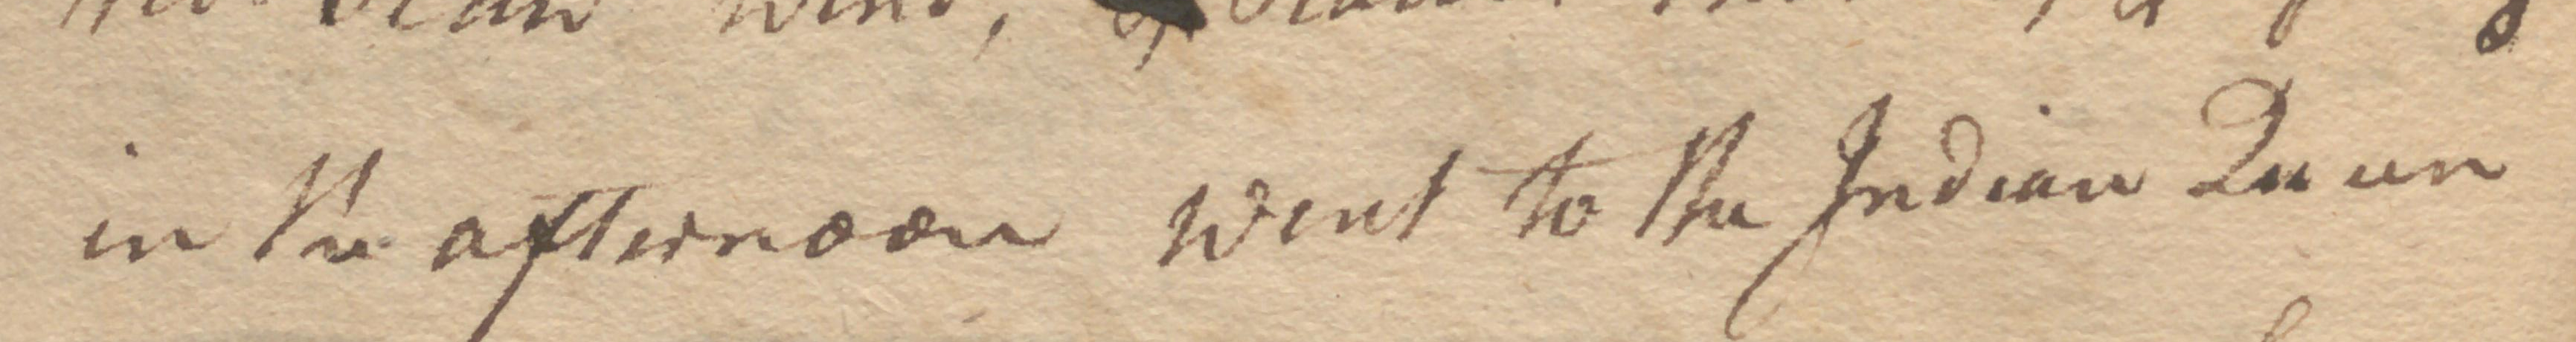in the afternoon went to the Indian Queen
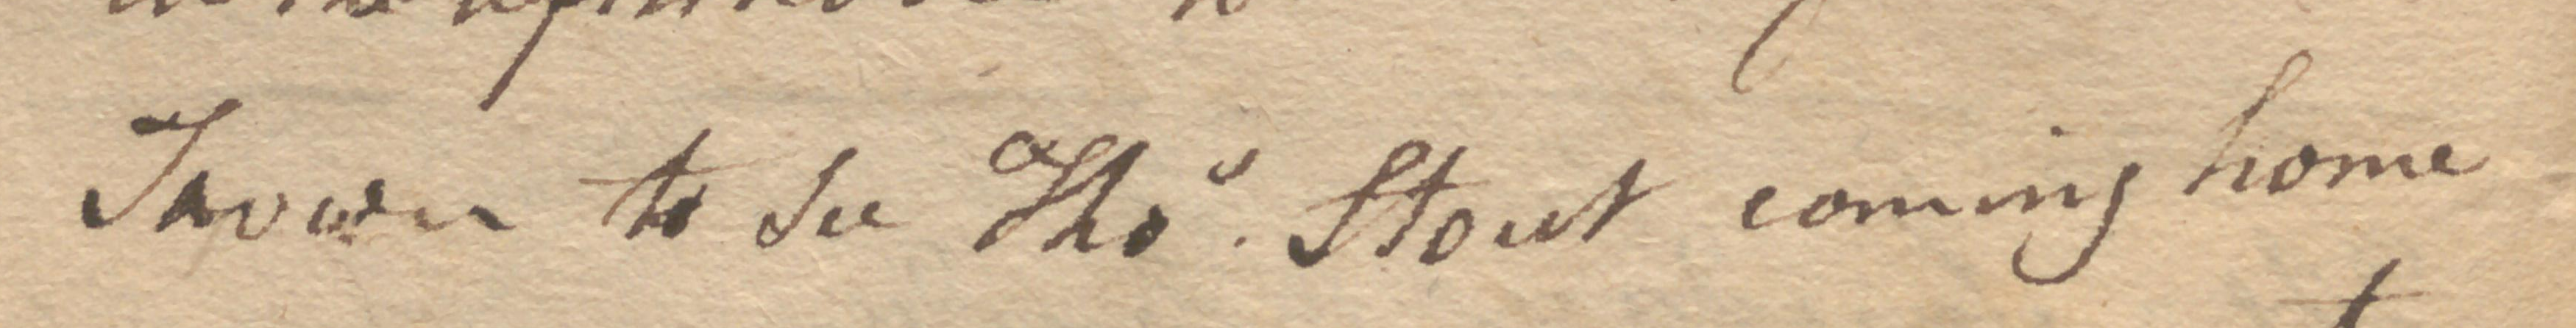Tavern to see Tho^s. Stout coming home
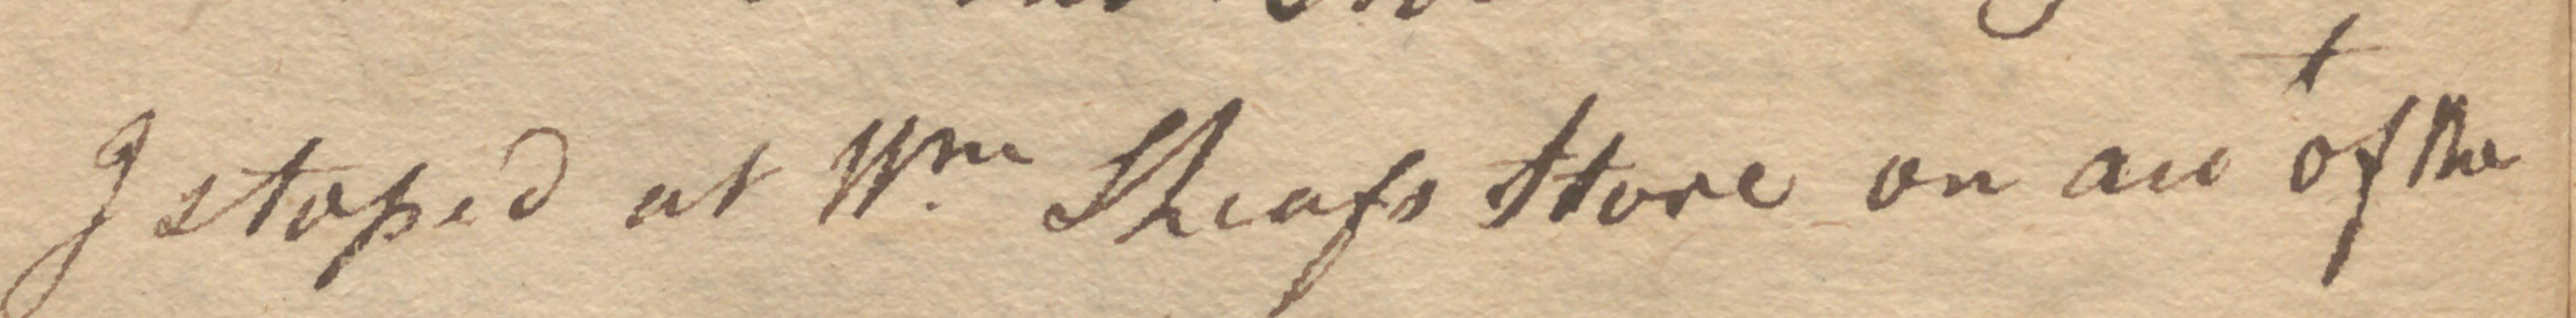I stoped at W^m. Sheafs Store on acc^t of the
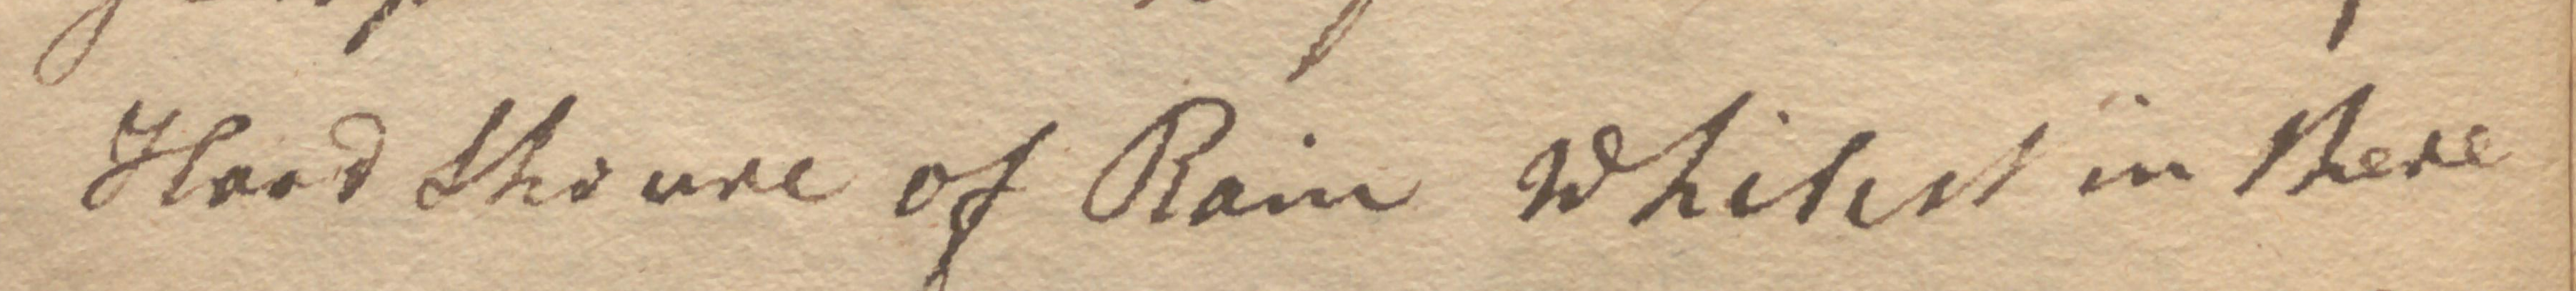Hard Shoure of Rain Whitest in there
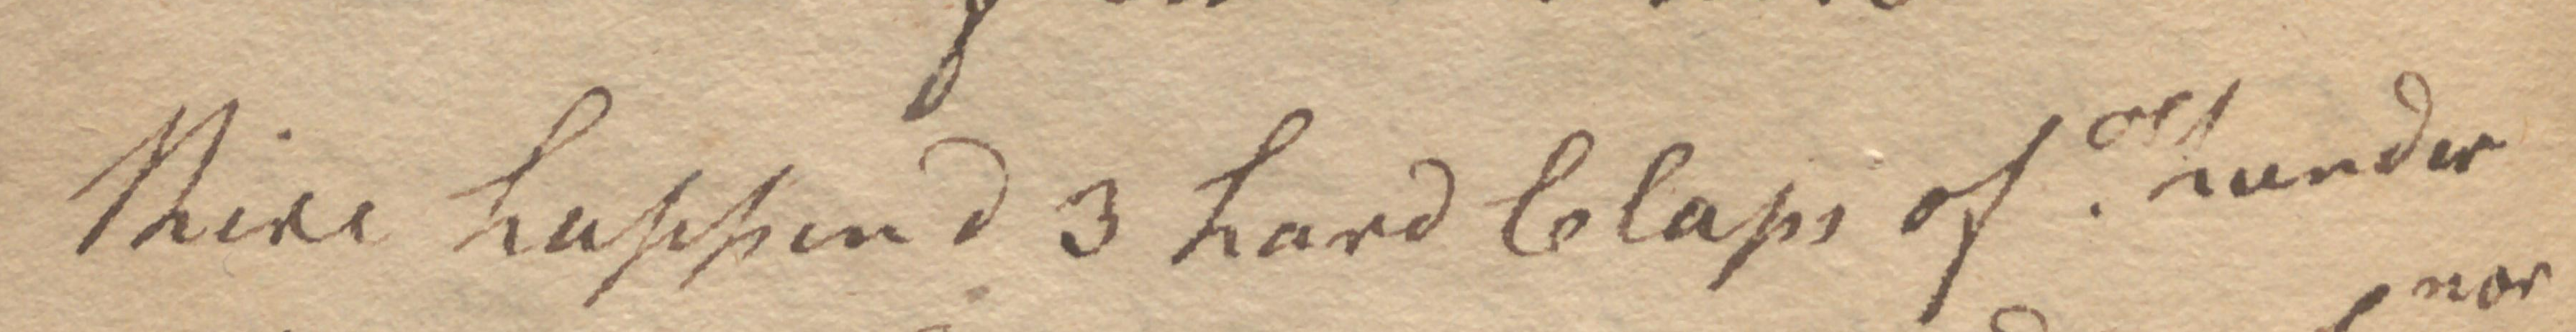thise happend 3 hard Claps of Thunder
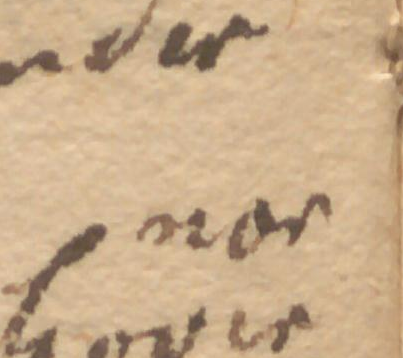nor
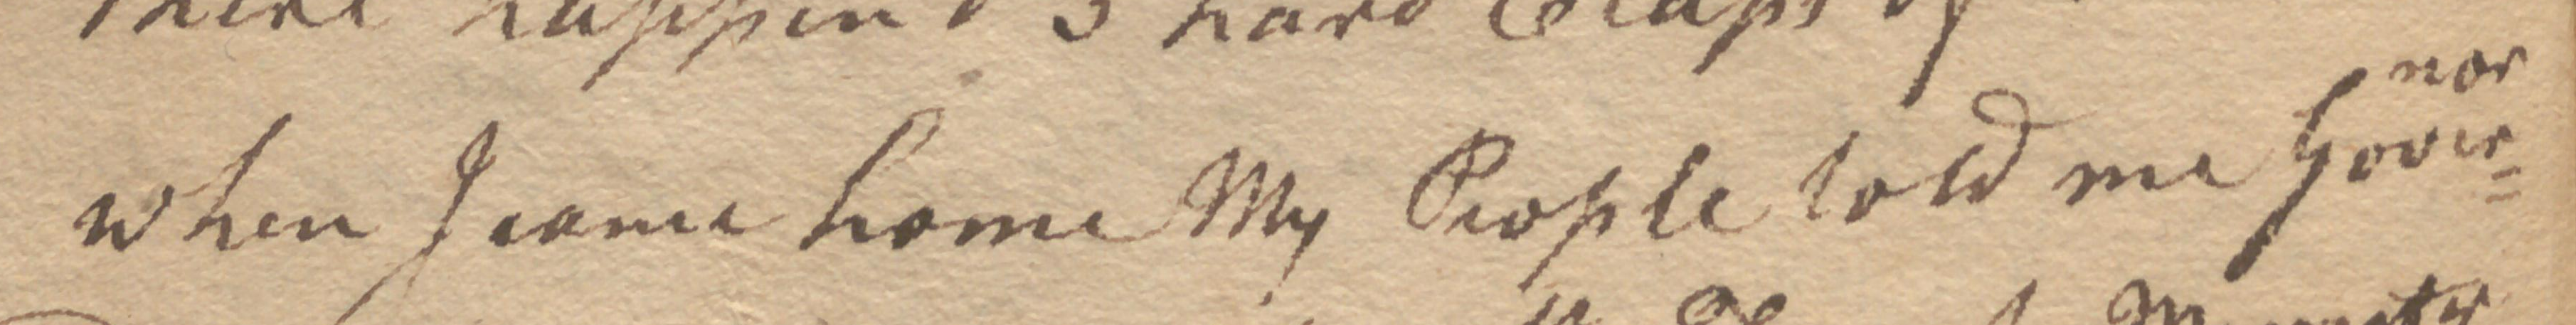when I came home My People told me Gover-
